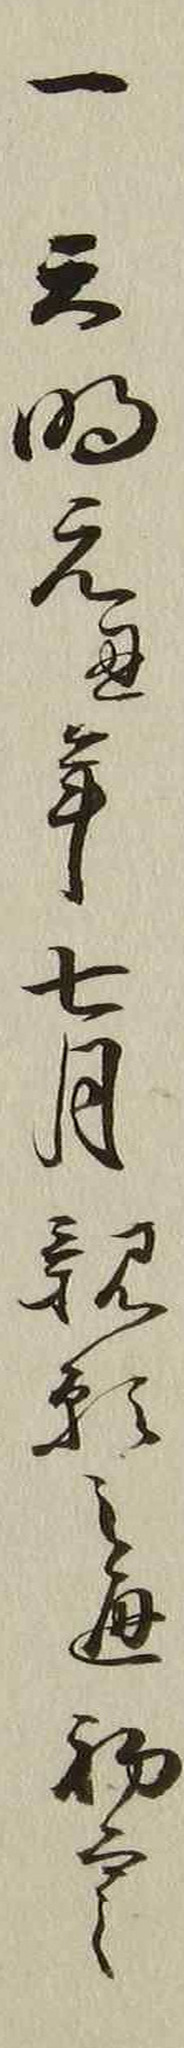一天明元丑年七月親願之通初而之
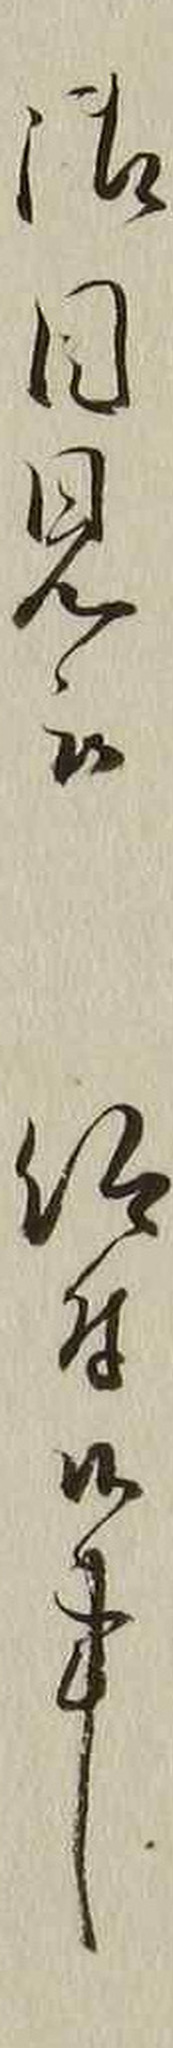御目見被仰付候事
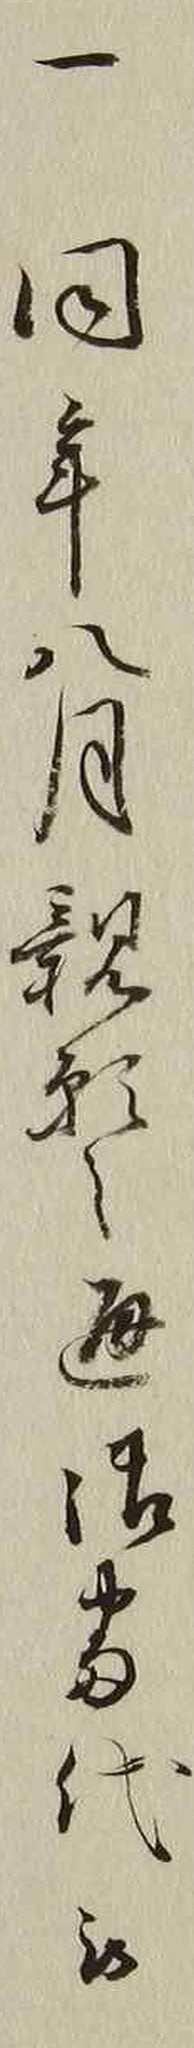一同年八月親願之通御番代被
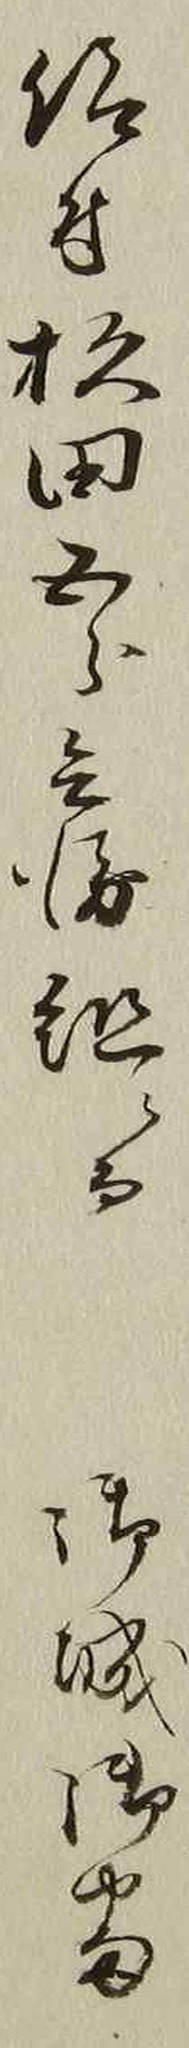仰付杉田五郎兵衛組ニ而御城御番
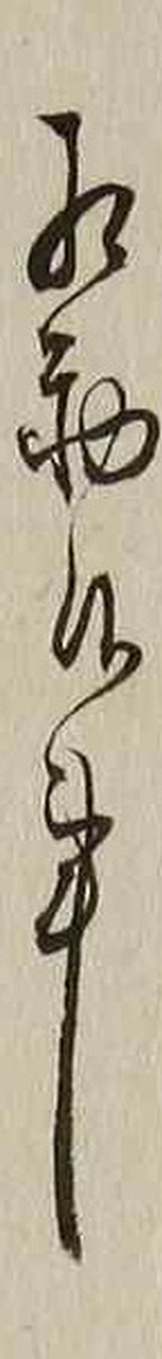相勤候事
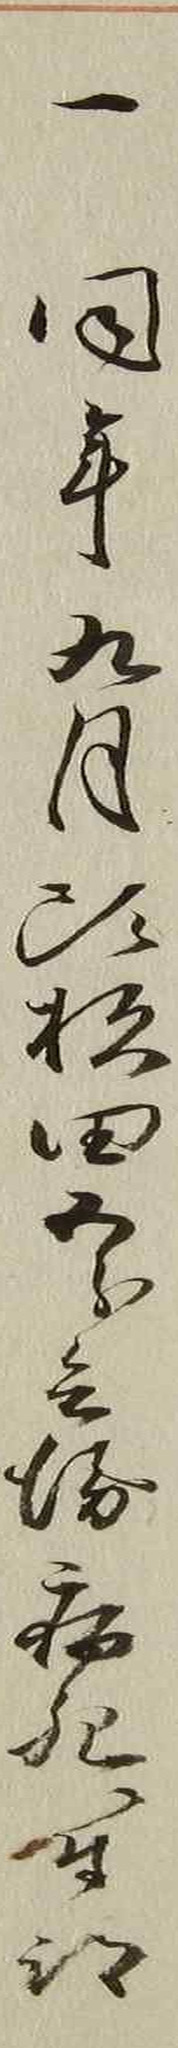一同年九月頭杉田五郎兵衛病死ニ付跡
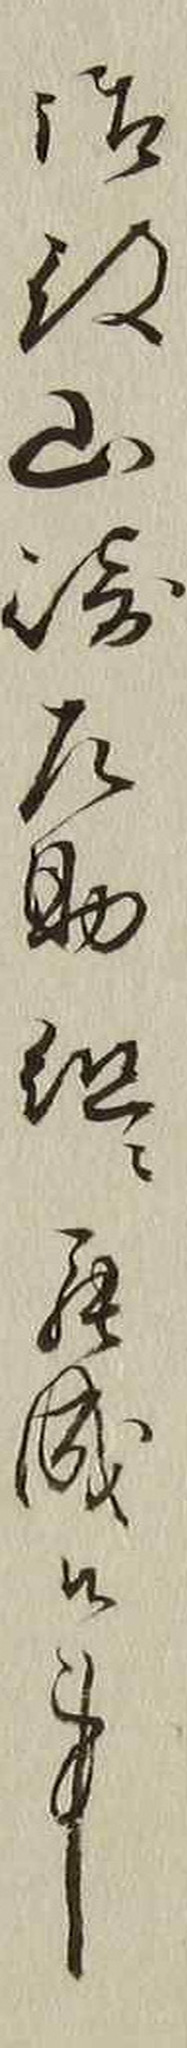御役山崎左助組ニ罷成候事
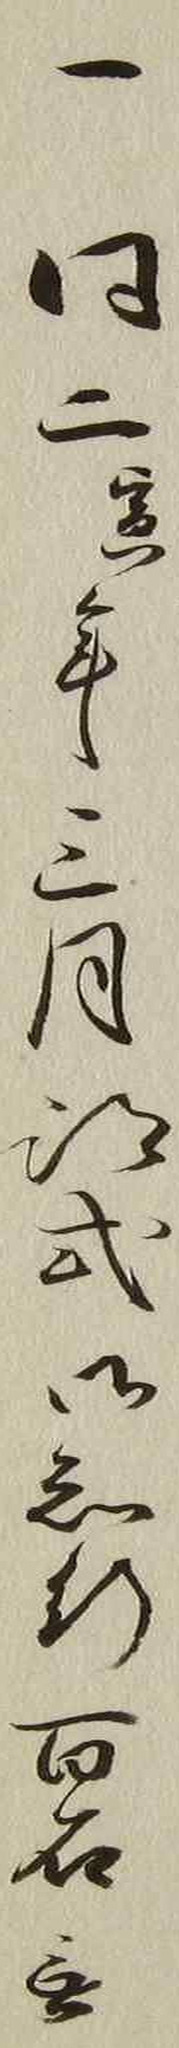一同二寅年三月跡式御知行百石無
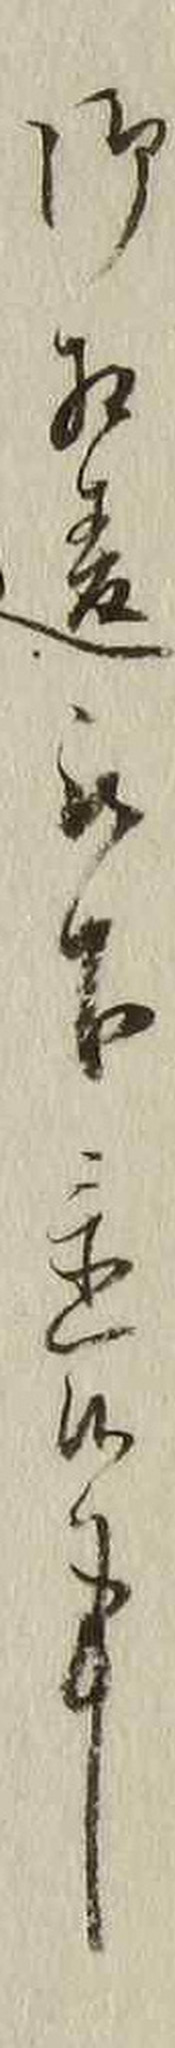御相違被下置候事
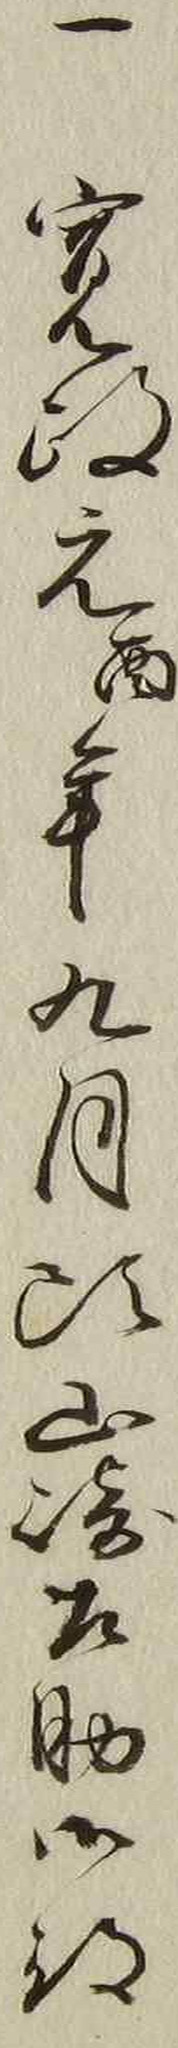一寛政元酉年九月頭山崎左助御役
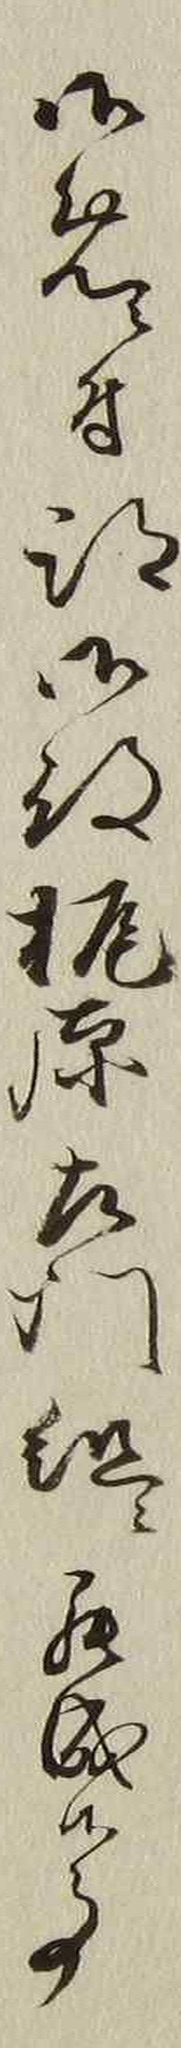御免ニ付跡御役梶原左門組ニ罷成候事
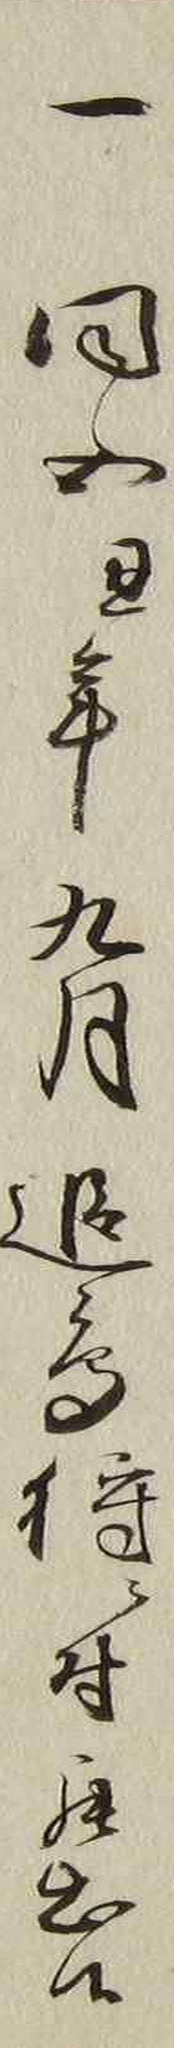一同五丑年九月追鳥狩ニ付罷出候
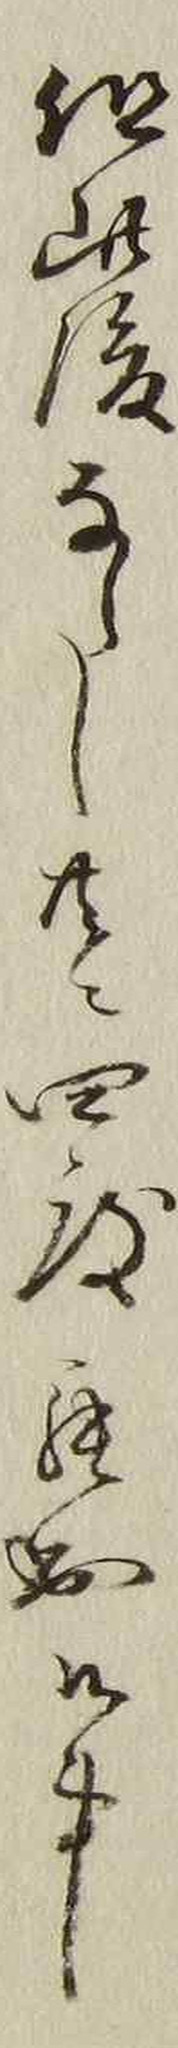但此後ならし共ニ四度罷出候事
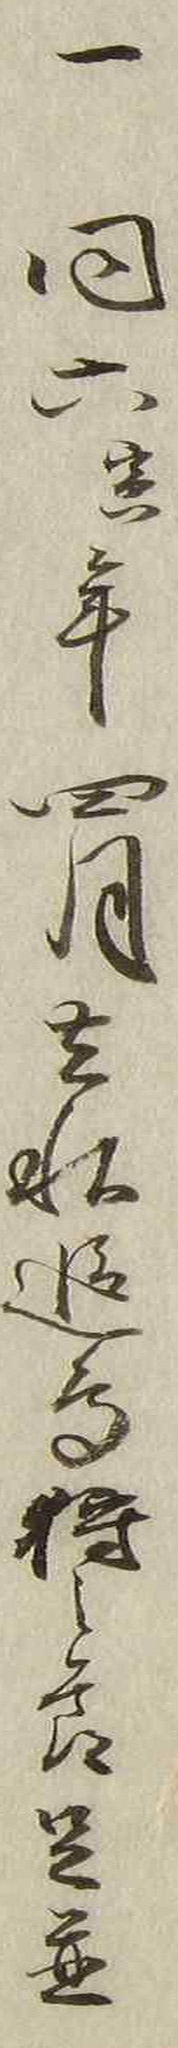一同六寅年四月去秋追鳥狩之節足並
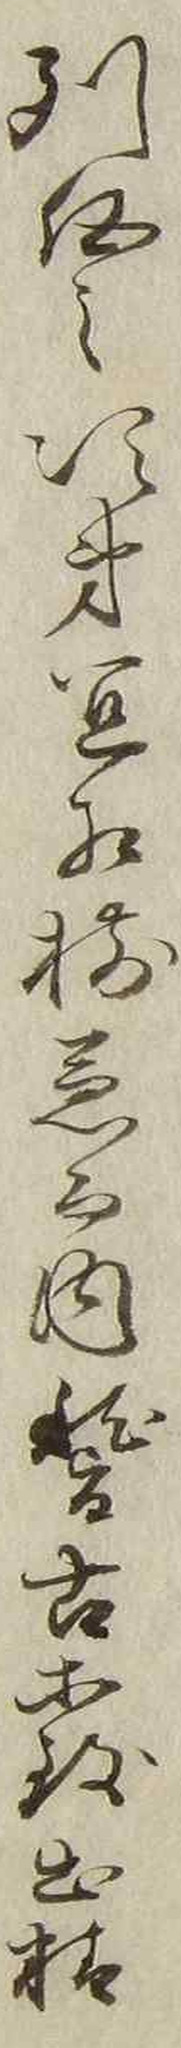列伍之次第宜相揃兼而内稽古等出精

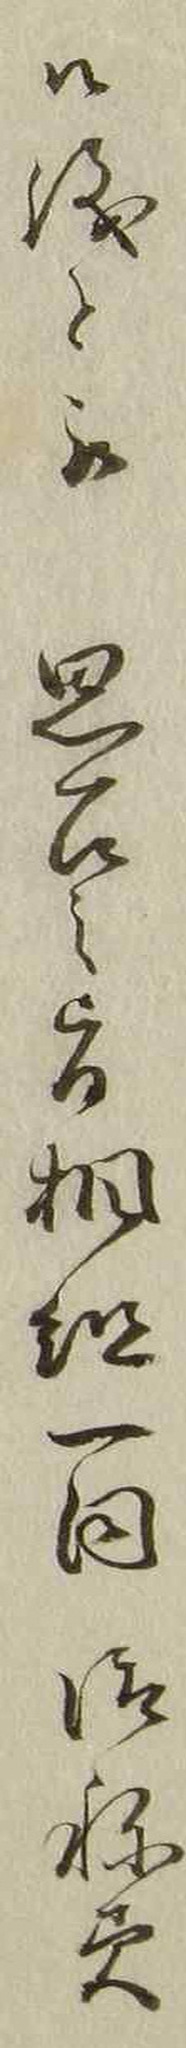候義と被思召之旨相組一同御称美
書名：諸士系譜　巻之26　い之部26
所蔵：会津若松市立会津図書館
